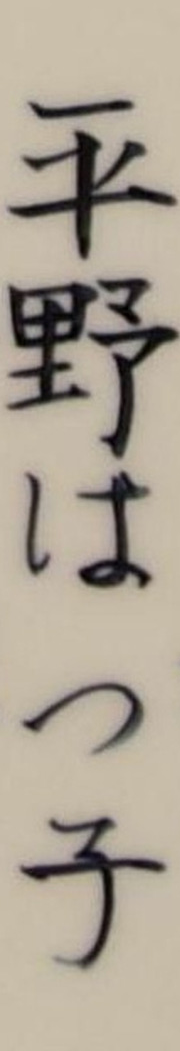平野はつ子
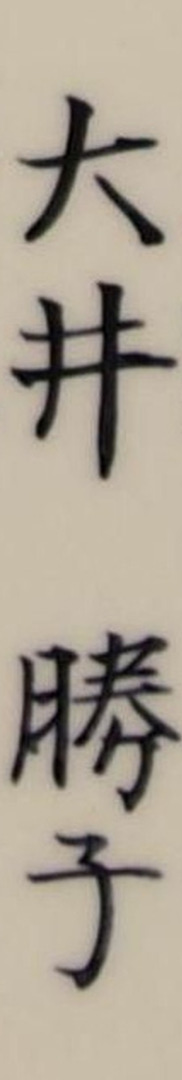大井勝子
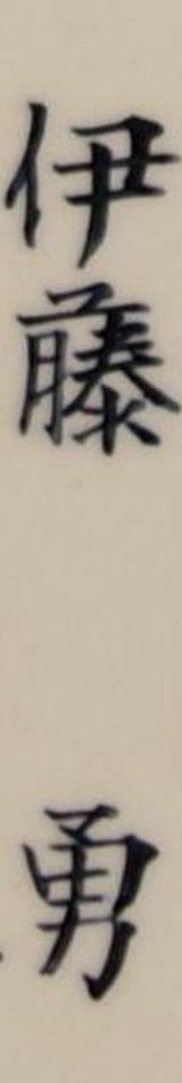伊藤勇
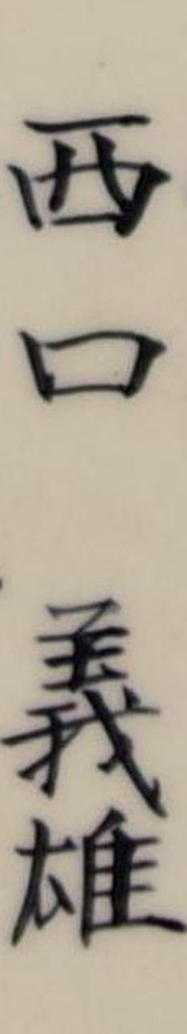西口義雄
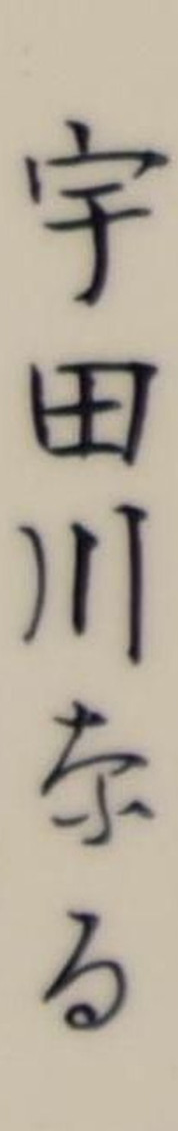宇田川なる
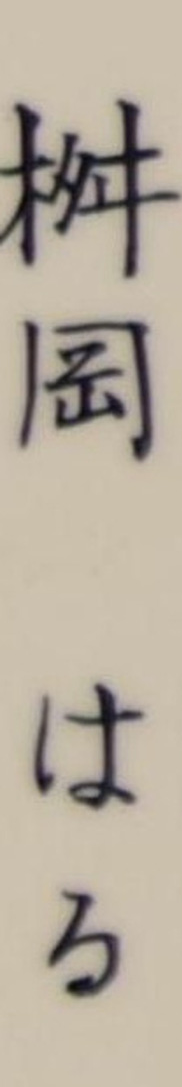桝岡はる
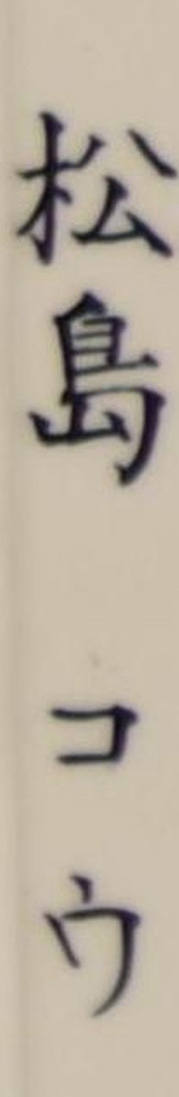松島コウ

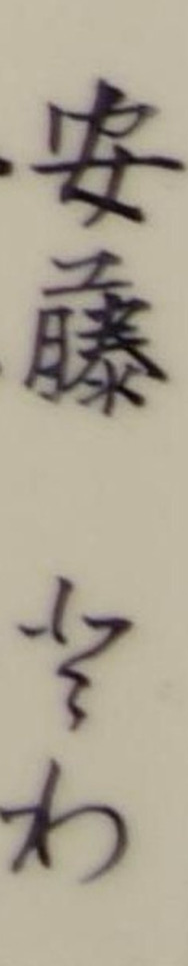安藤とわ
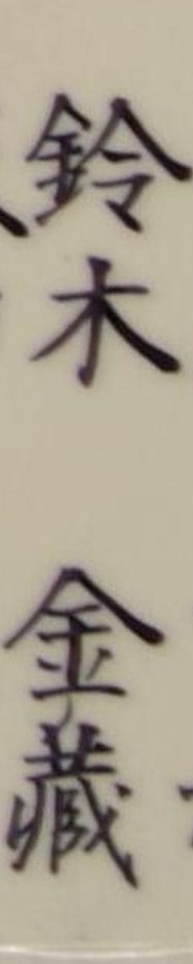鈴木金蔵
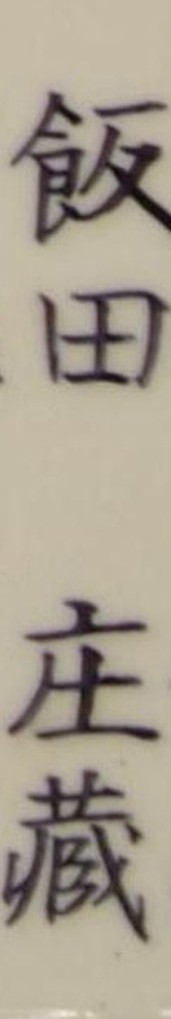飯田庄蔵
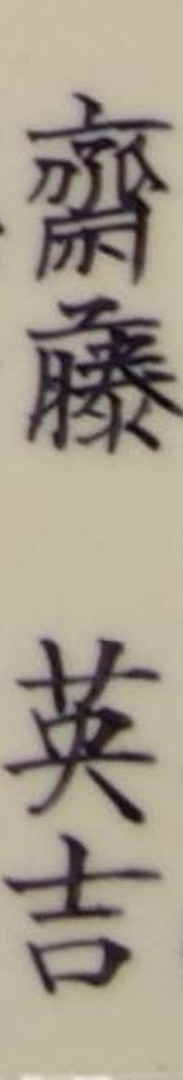齋藤英吉
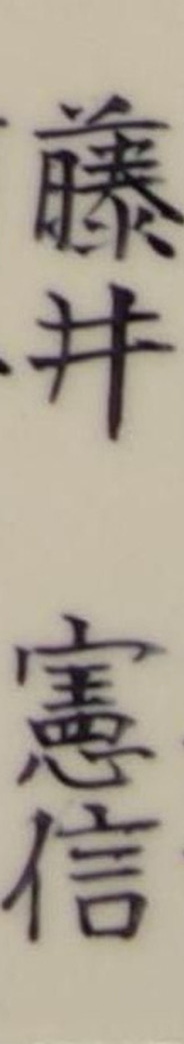藤井憲信
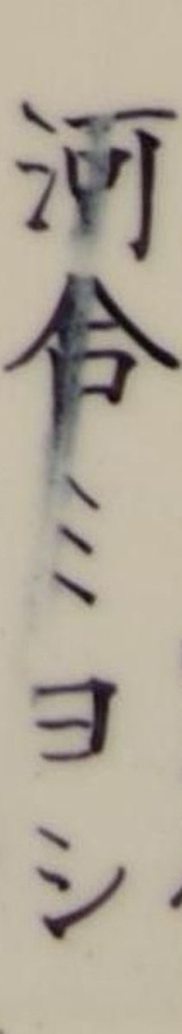河合ミヨシ
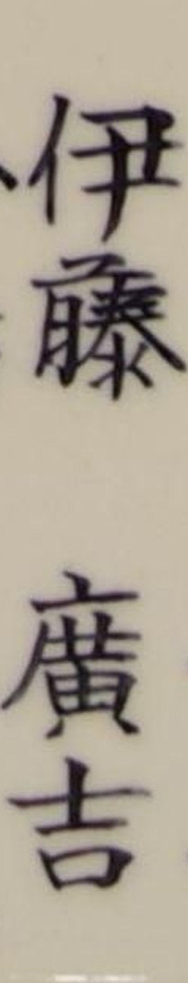伊藤廣吉
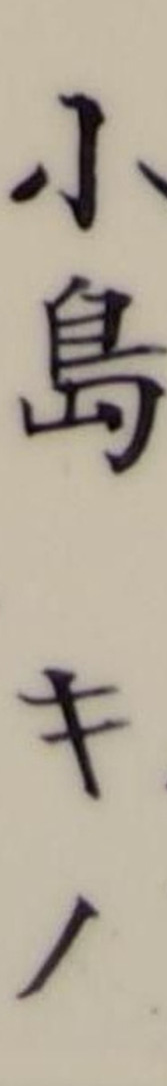小島キノ
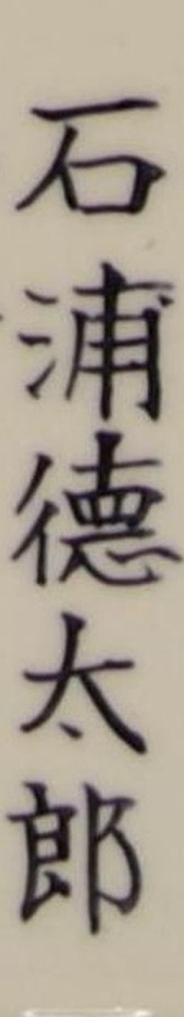石浦徳太郎
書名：M~S
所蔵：高野山金剛峯寺
